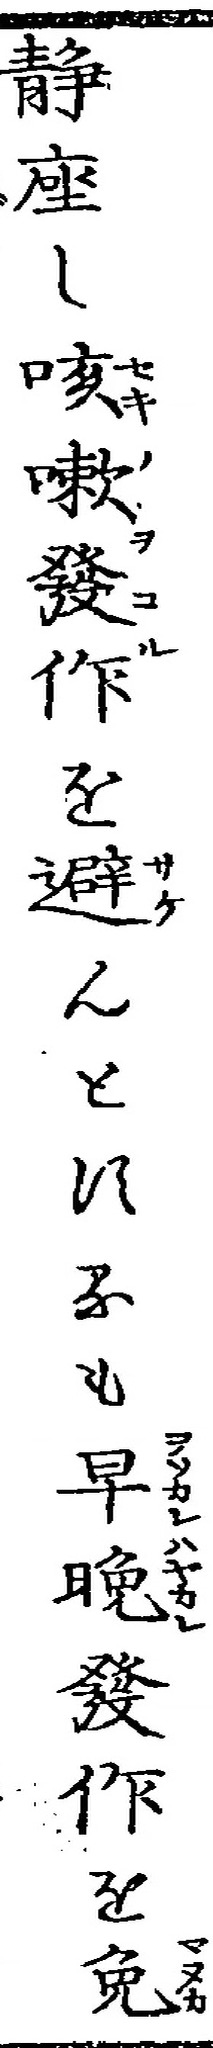静座し咳嗽発作を避んとするも早晩発作を免
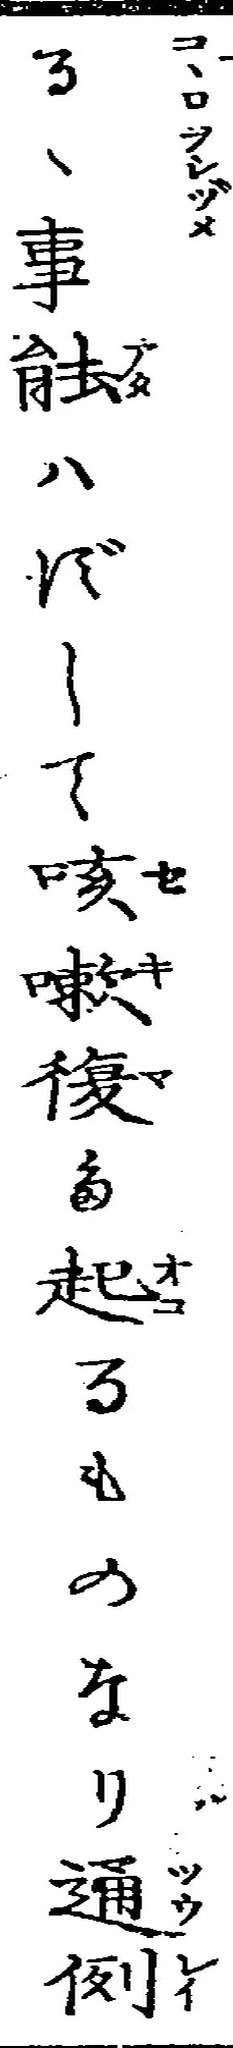るゝ事能はずして咳嗽復た起るものなり通例
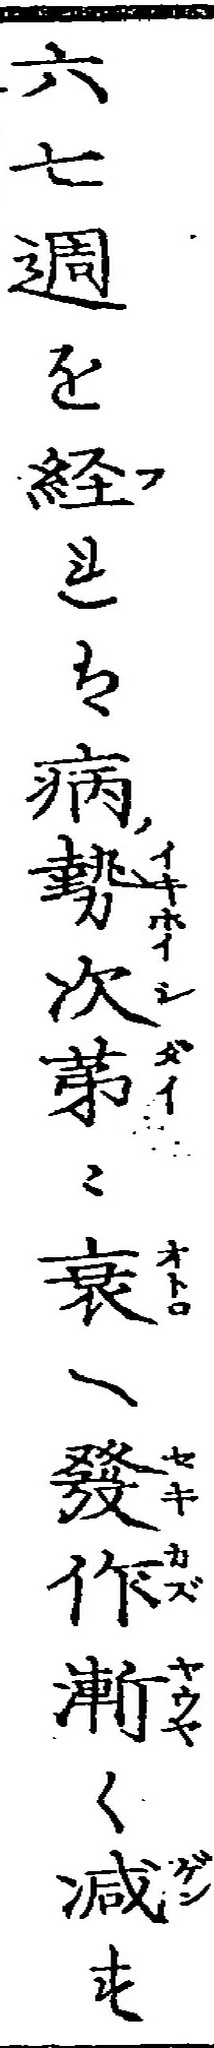六七週を経れは病ノ勢次第に衰へ発作漸く減す
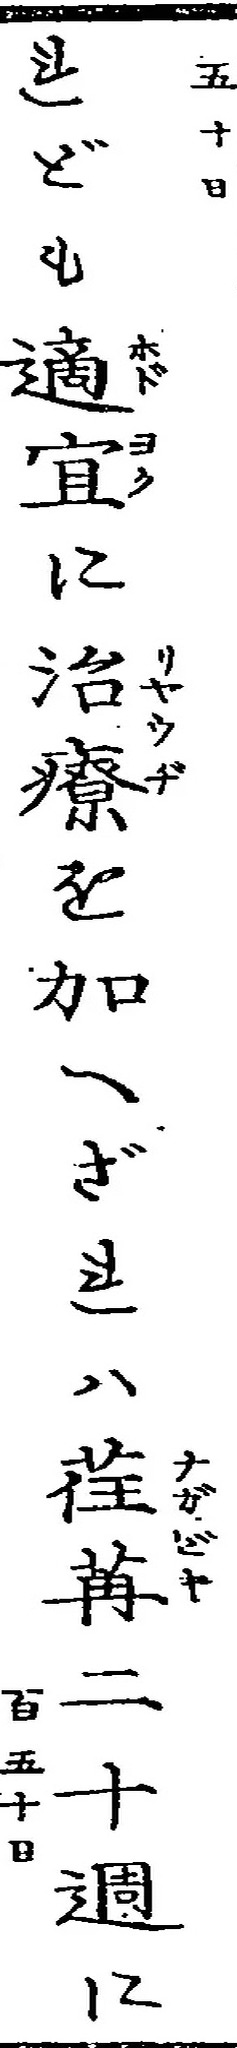れども適宜に治療を加へざれば荏苒二十週に
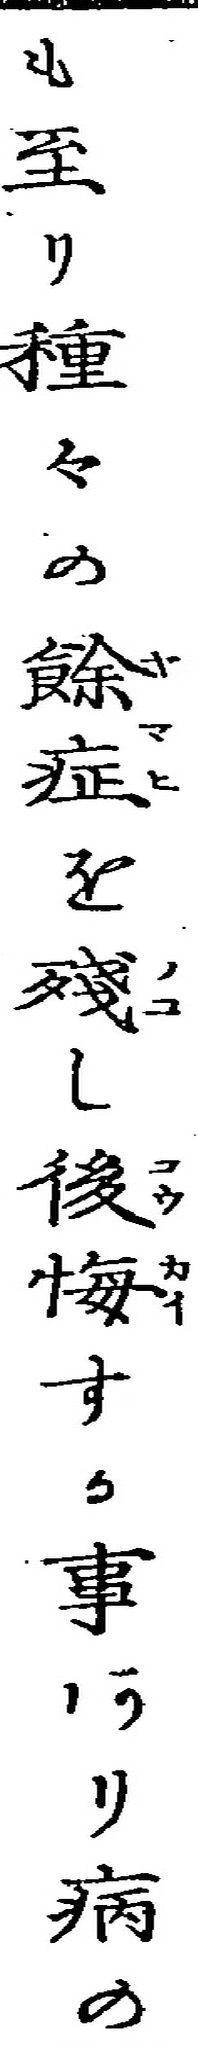も至り種々の余症を残し後悔する事あり病の
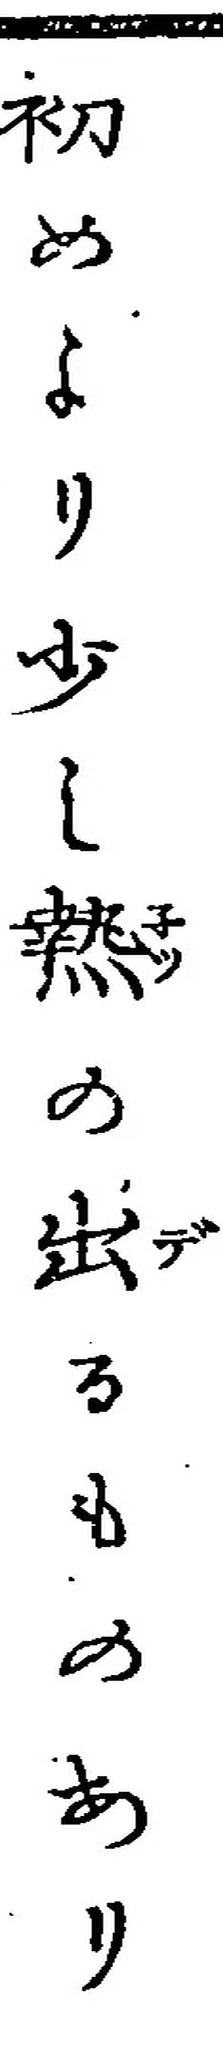初めより少し熱の出るものあり
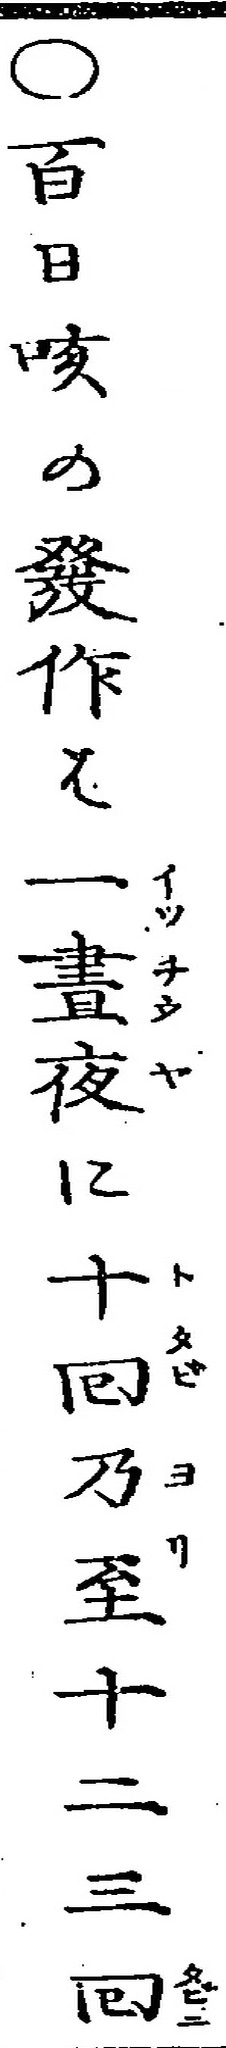○百日咳の発作は一昼夜に十回乃至十二三回
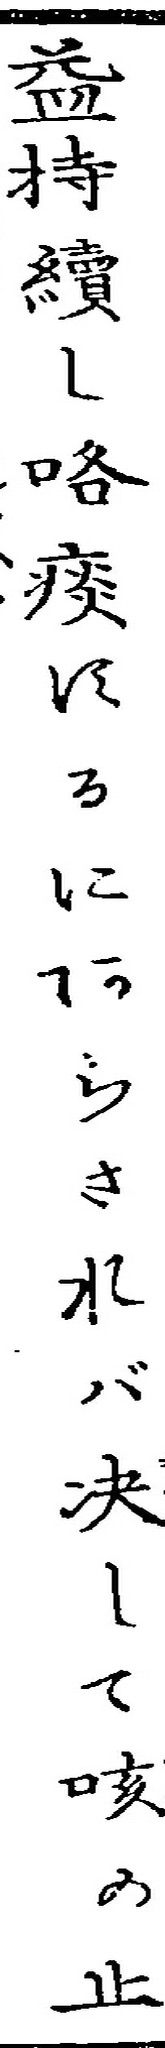益持続し咯痰するにあらされば決して咳の止
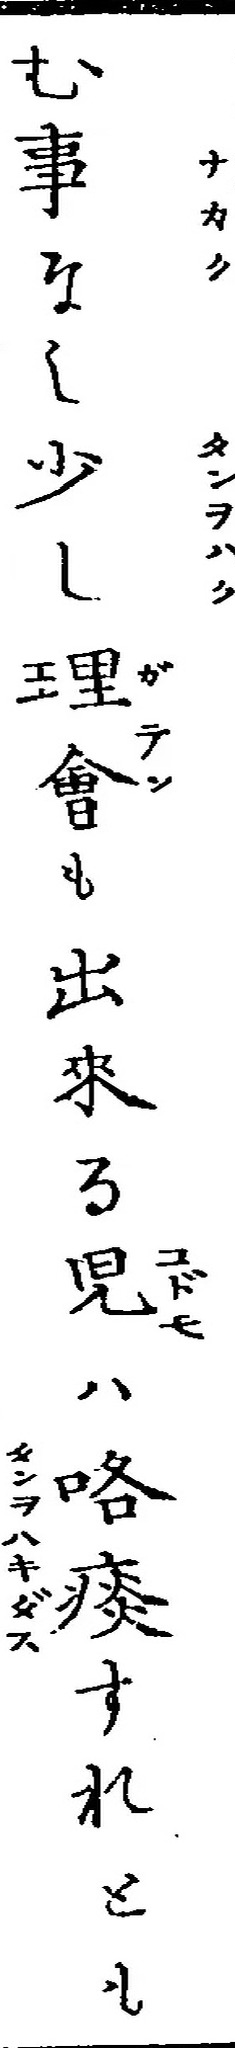む事なし少し理会も出来る児は咯痰すれとも
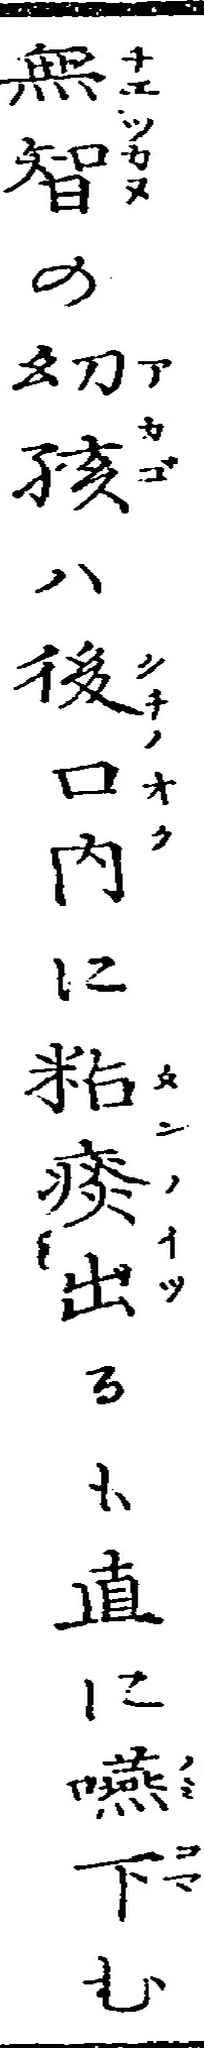無智の幼孫は後口内に粘痰出るも直に嚥下む
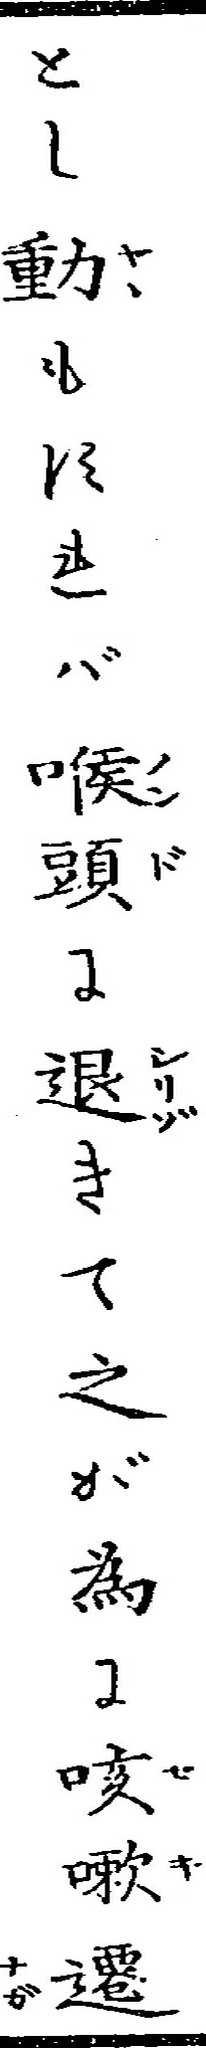とし動もすれば喉頭に退きて之が為に咳嗽遷
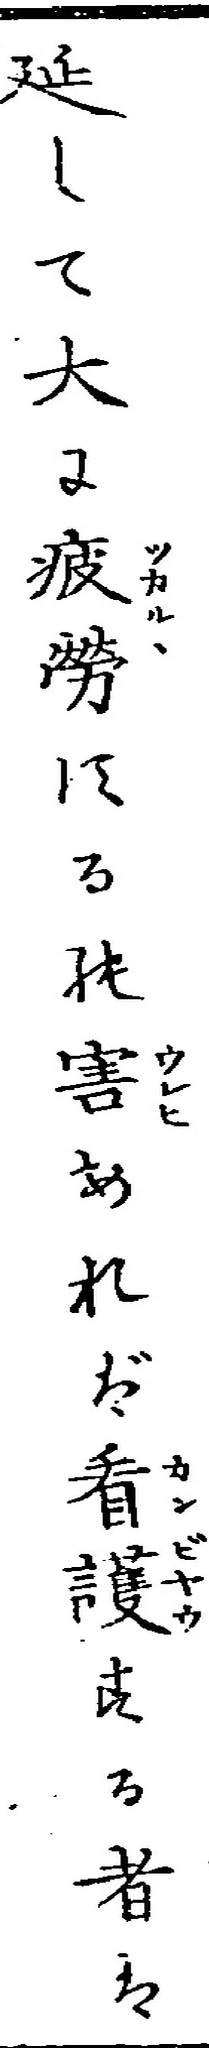延して大に疲労するの害あれば看護する者は
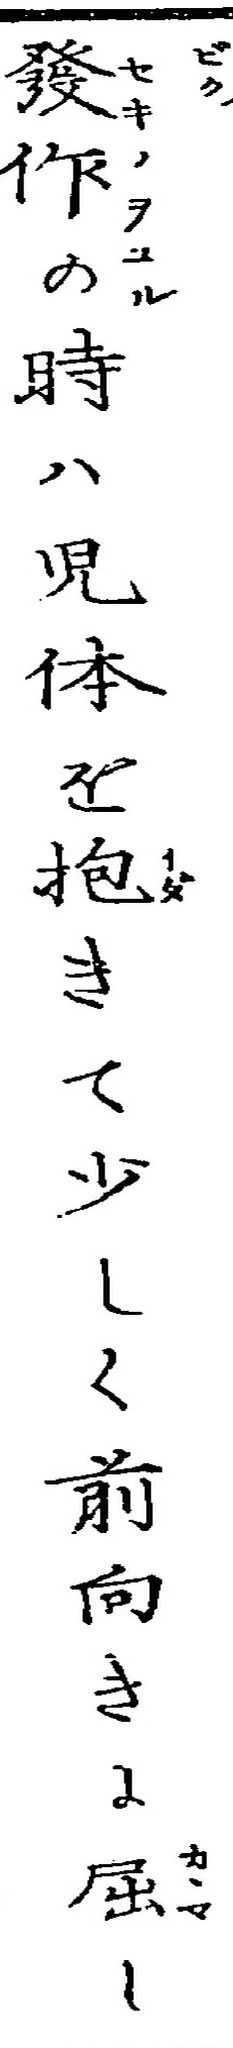発作の時は児体を抱きて少しく前向きに屈し
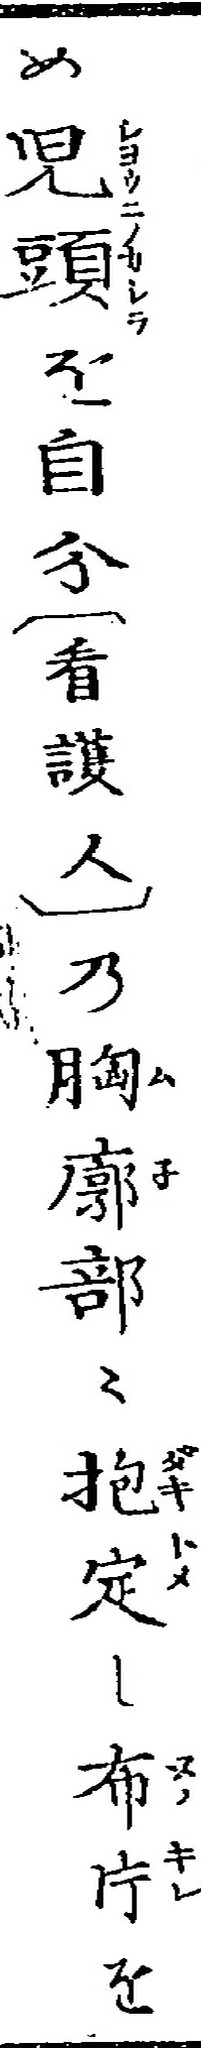め児頭を自分[看護人]の胸廓部に抱定し布片を
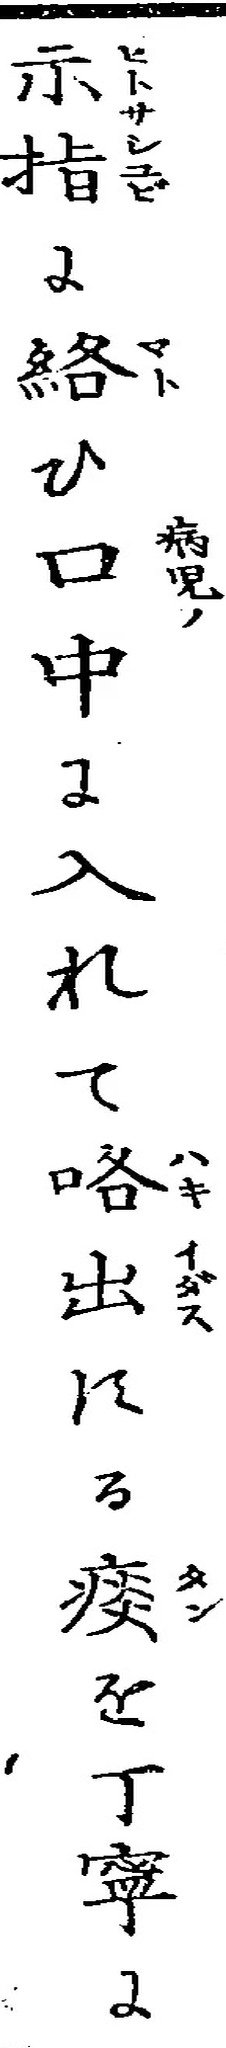示指に絡ひ口中に入れて咯出する痰を丁寧に
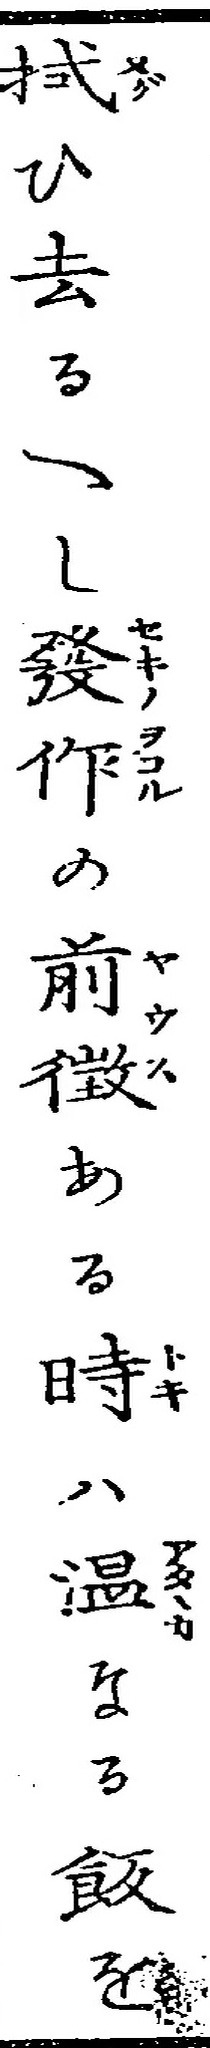拭ひ去るへし発作の前徴ある時は温なる飯を
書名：伝染病予防法
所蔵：国立国会図書館 National Diet Library, JAPAN
